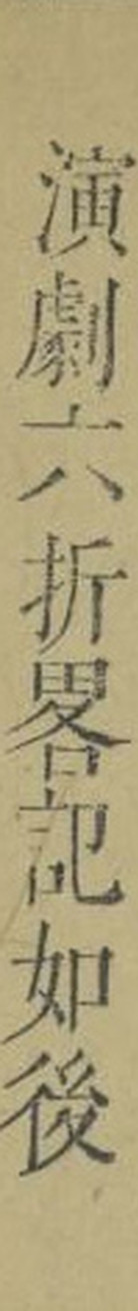演劇六折畧記如後
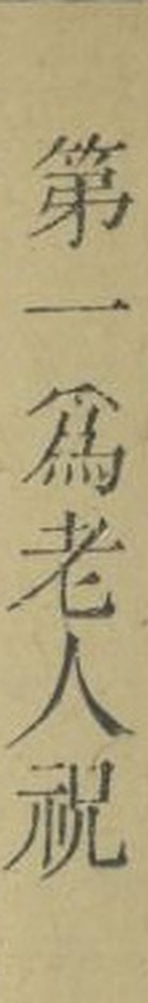第一爲老人祝
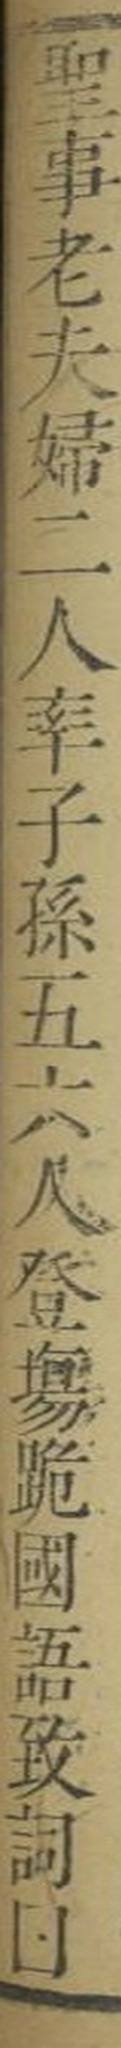聖事老夫婦二人率子孫五六人登塲跪國語致詞曰
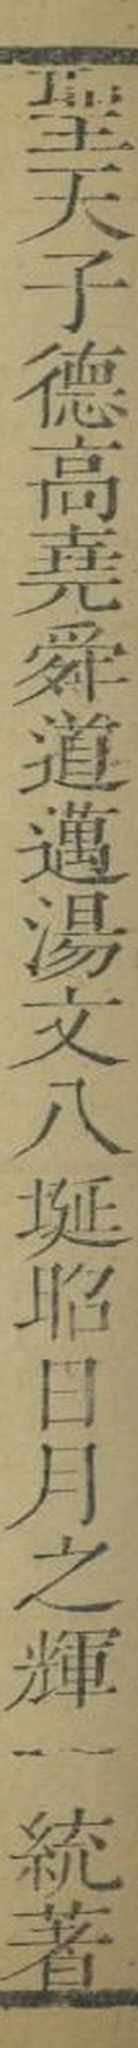聖天子德高堯舜道邁湯文八埏昭日月之輝一統著
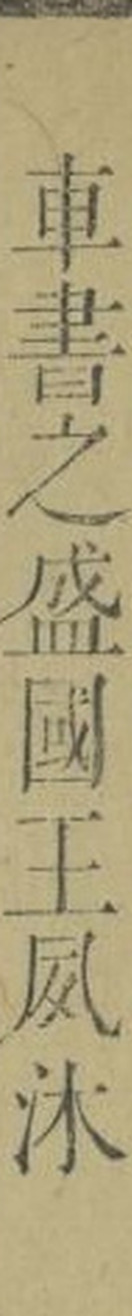車書之盛國王夙沐
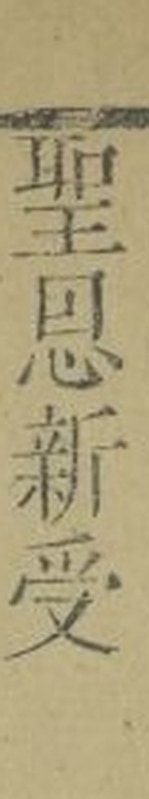聖㤙新受
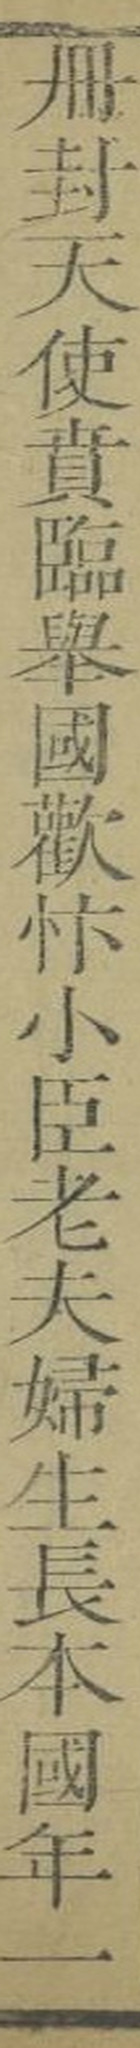冊封天使賁臨擧國歡忭小臣老夫婦生長本國年一
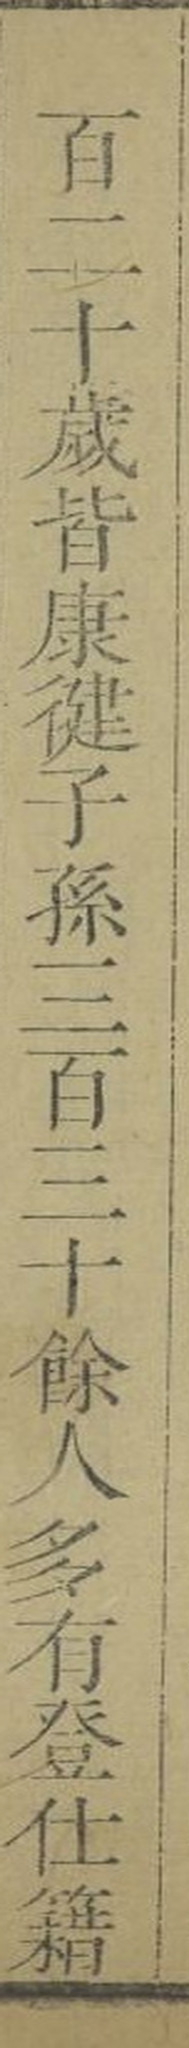百二十歲皆康徤子孫三百三十餘人多有登仕籍
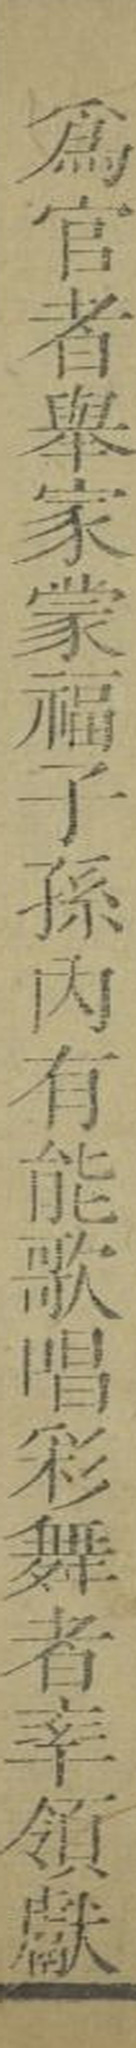爲官者擧家蒙福子孫内有能歌唱彩舞者率領獻
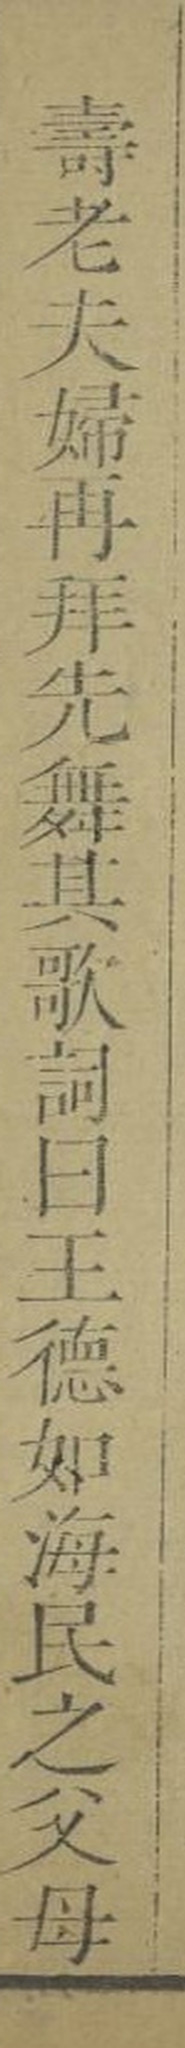壽老夫婦再拜先舞其歌詞曰王德如海民之父母
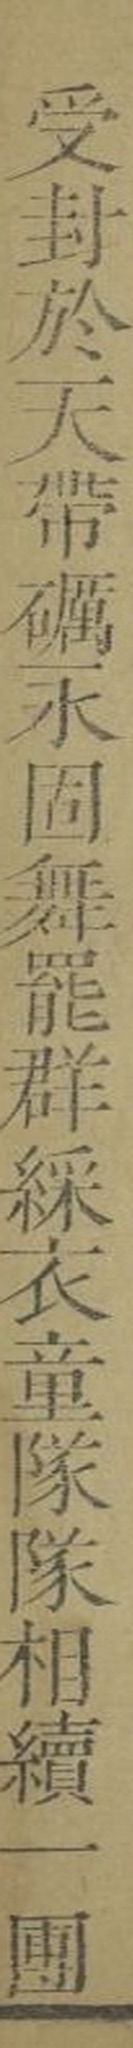受封於天帶礪永固舞罷群綵衣童隊隊相續一團

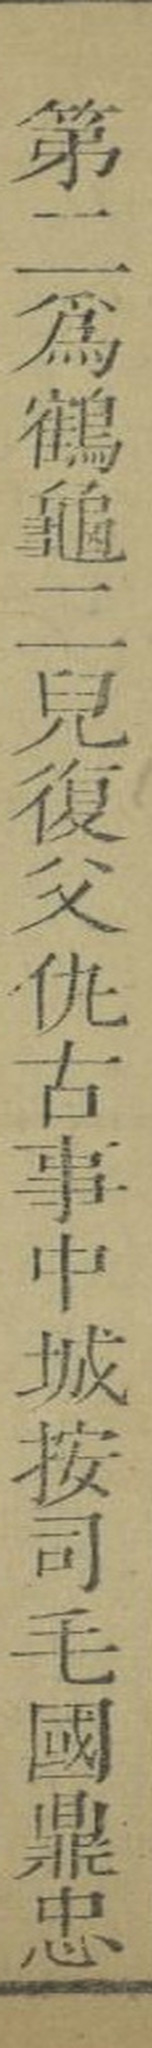第二爲鶴龜二兒復父仇古事中城按司毛國鼎忠
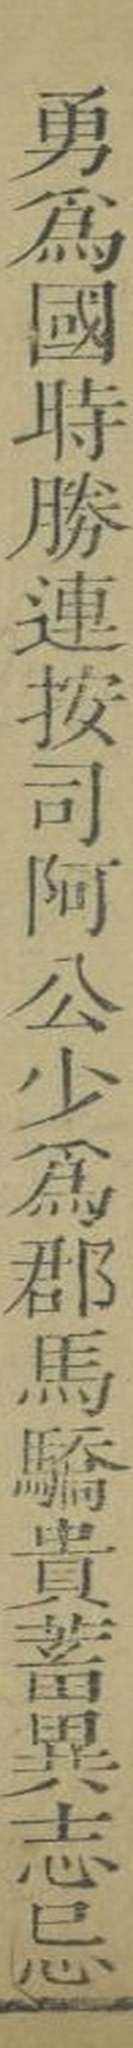勇爲國時勝連按司阿公少爲郡馬驕貴蓄異志忌
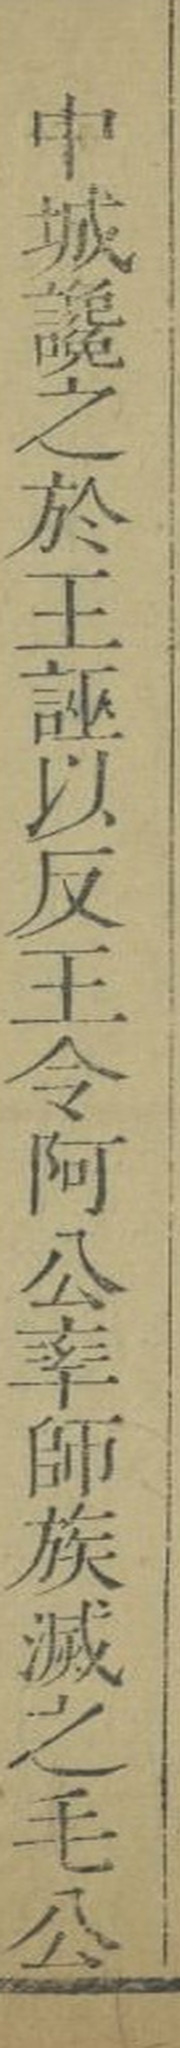中城讒之於王誣以反王令阿公率師族滅之毛公
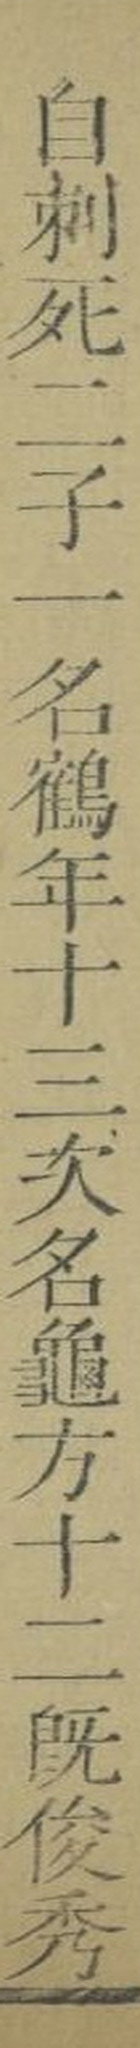自刺死二子一名鶴年十三次名龜方十二既俊秀
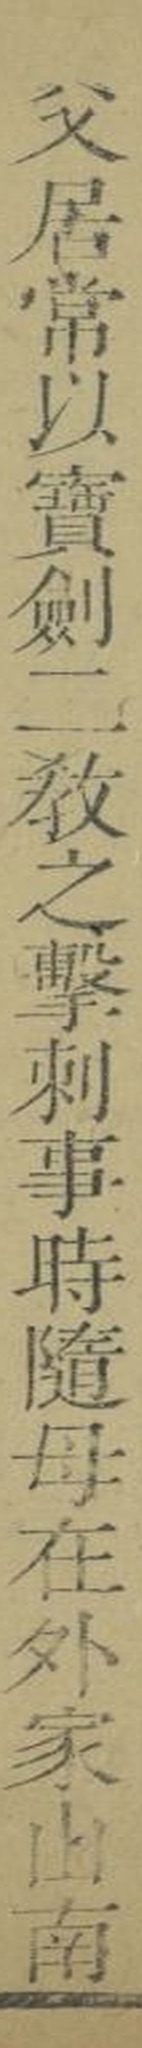父居常以寶劍二敎之擊刺事時隨母在外家山南
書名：中山伝信録 巻二
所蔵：University of the Ryukyus Library
